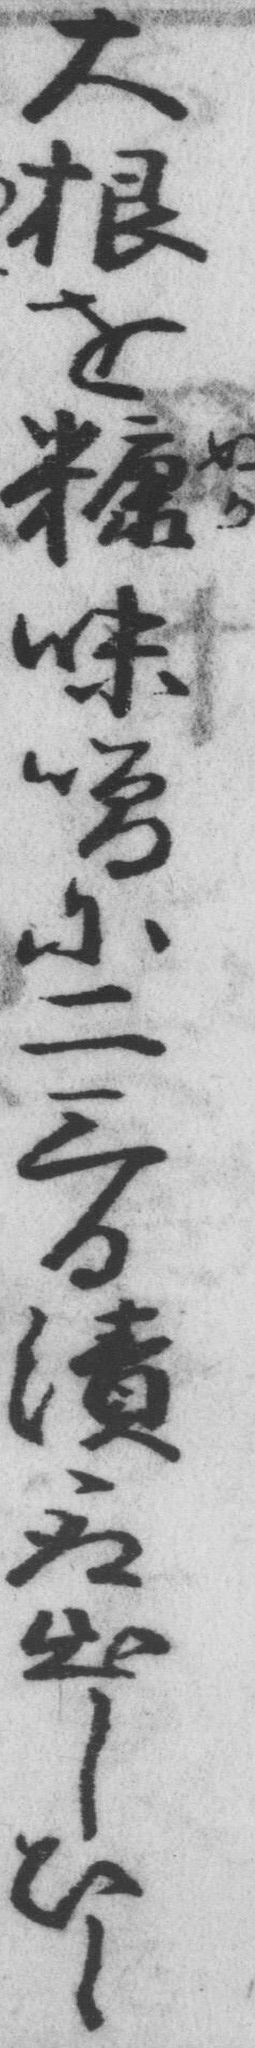大根を糠味噌に二三日漬取出しひし
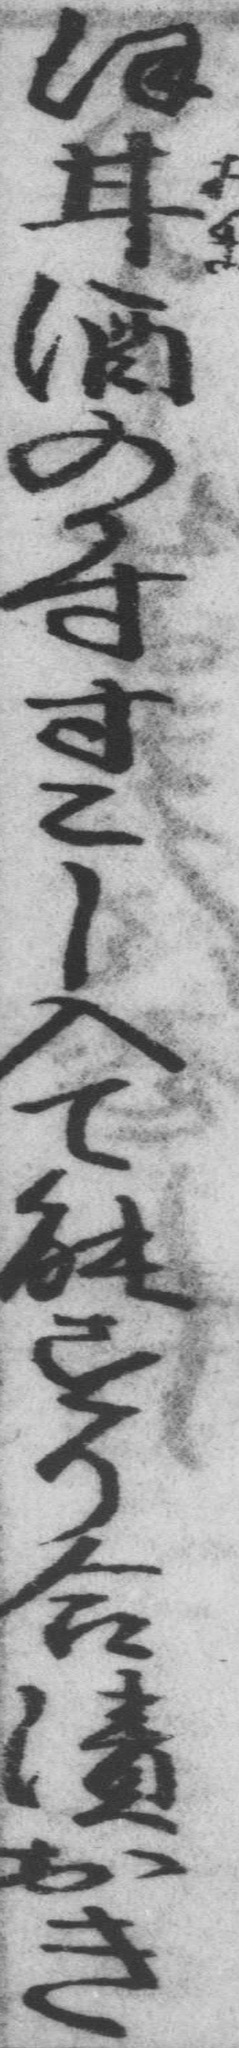ほ甘酒のかすすこし入て能すり合漬おき
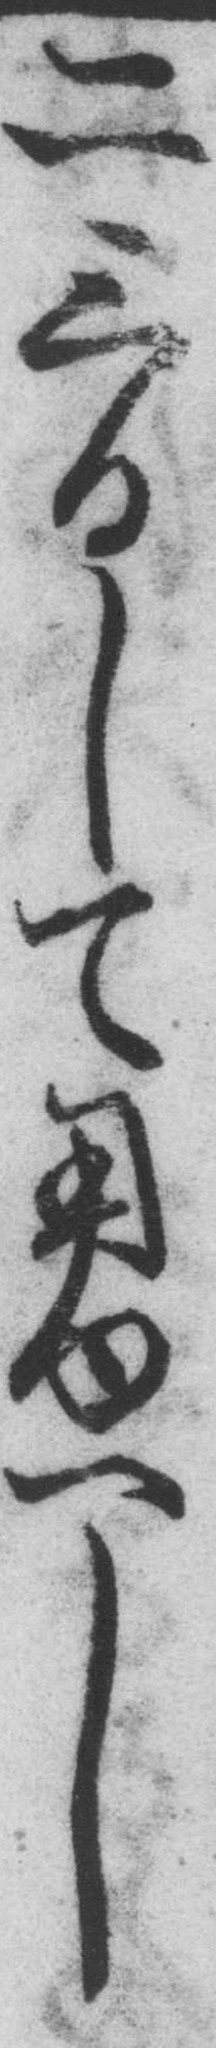二三日して用ゆへし
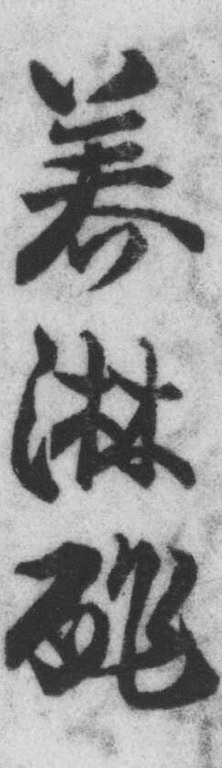美淋酢
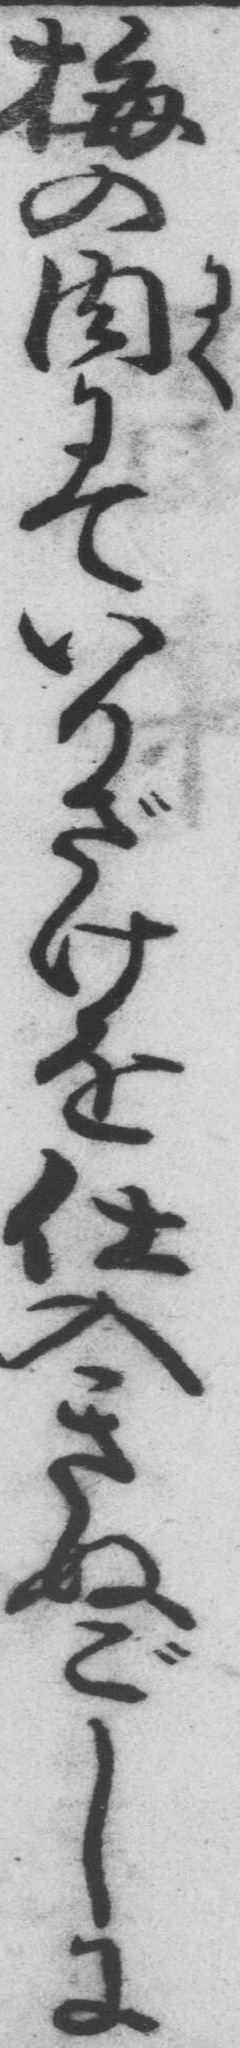梅の肉にていりざけを仕入きぬごしに
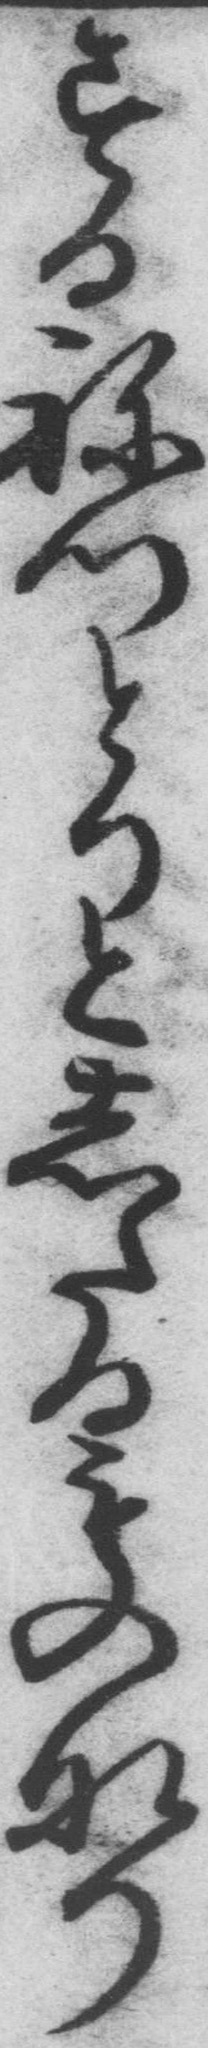するねつとりとしたるものなり
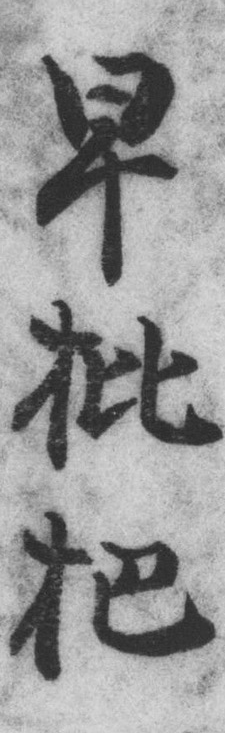早枇杷
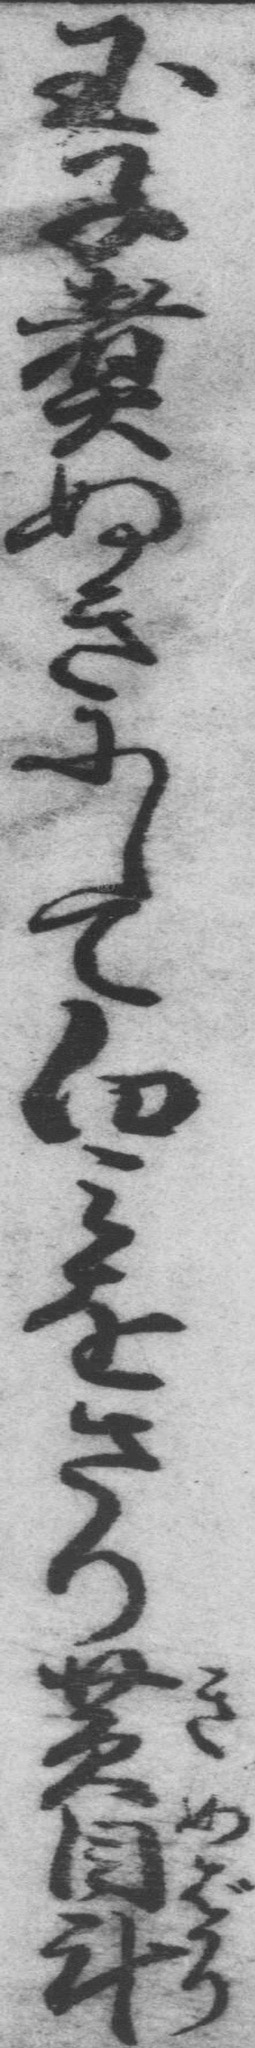玉子煮ぬきにして白みをさり黄目斗
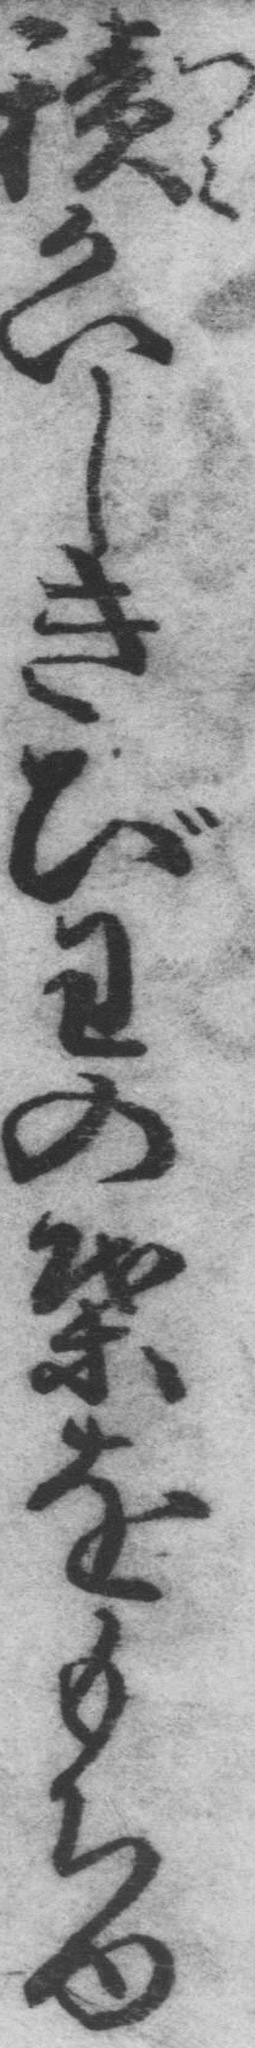積かいしきびわの葉をもちゆ

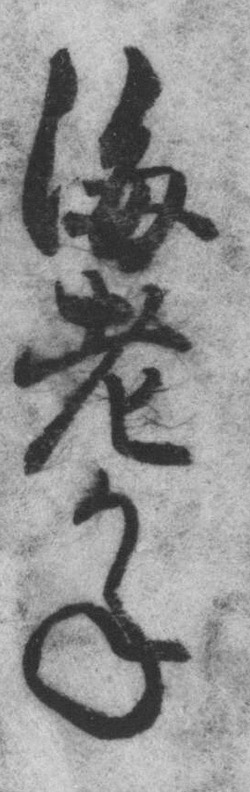海老かね
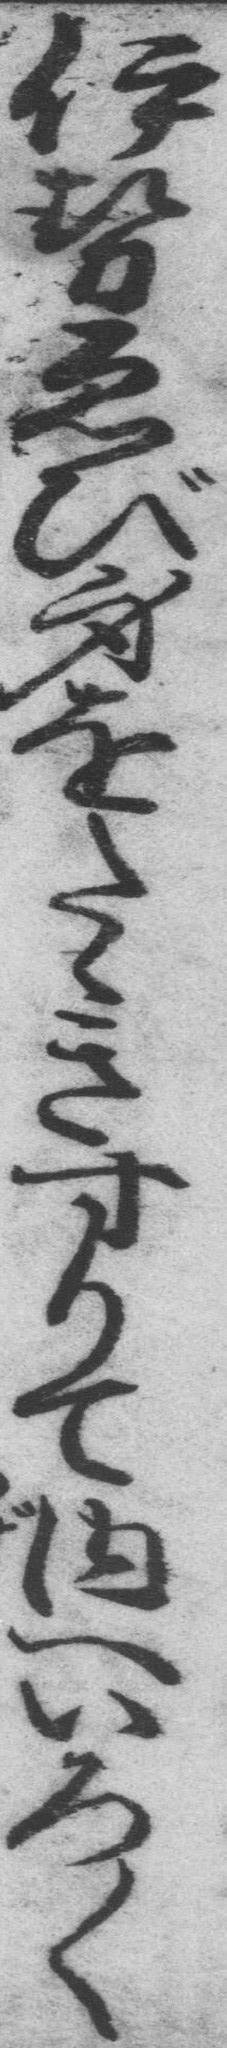伊勢ゑび身をたゝきすりて内へいろ〳〵
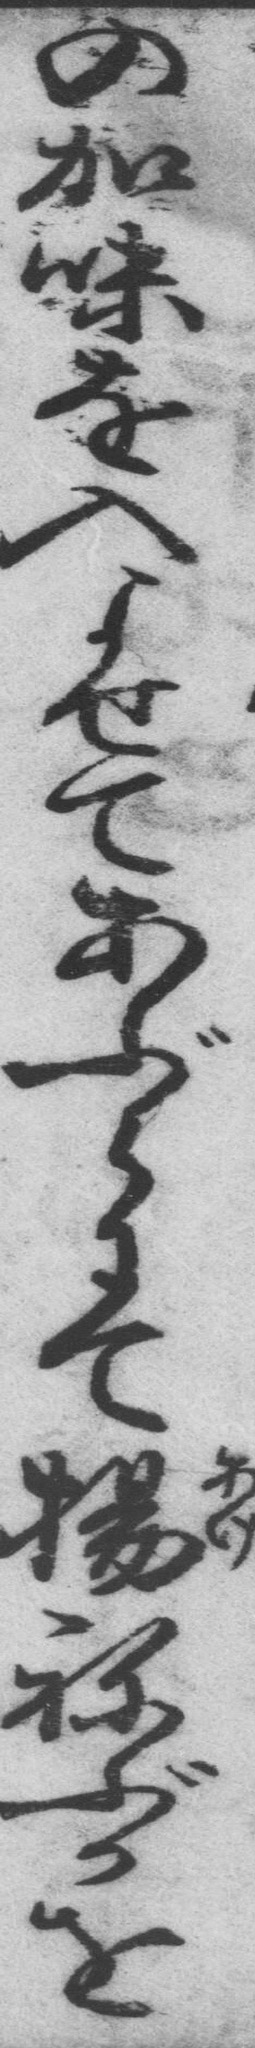の加味を入よせてあぶらにて揚ねぶかを
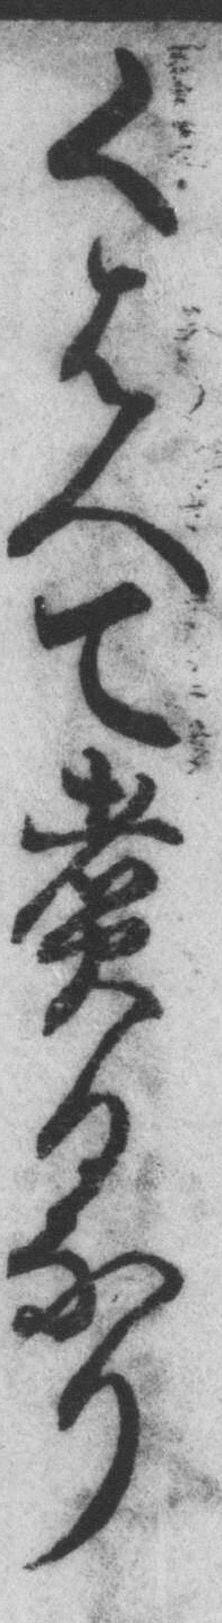くはへて煮るなり
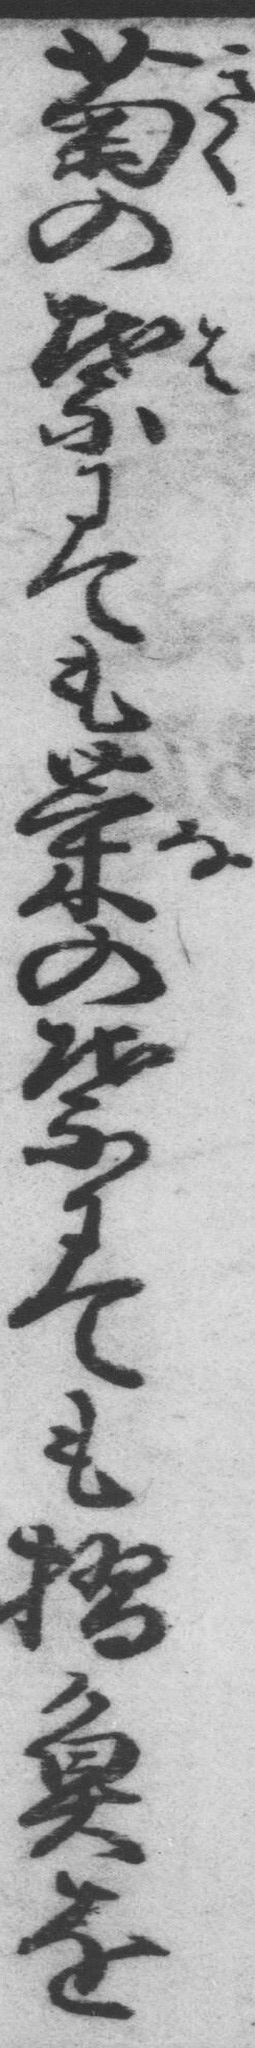菊の葉にても菜の葉にても摺魚を
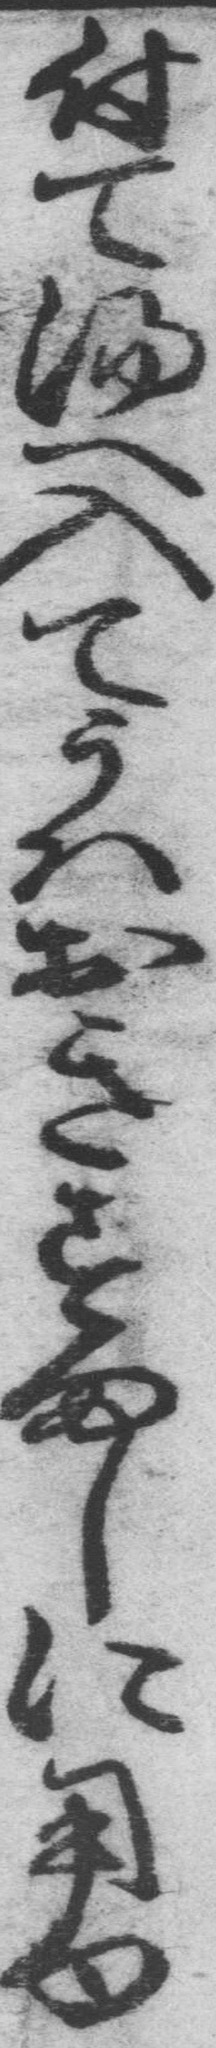付て湯へ入てうはおきすましに用ゆ
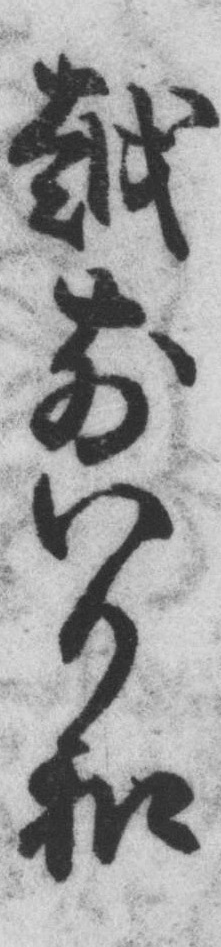越前いり和
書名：料理山海郷
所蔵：大阪府立大学学術情報センター 国文学研究資料館
